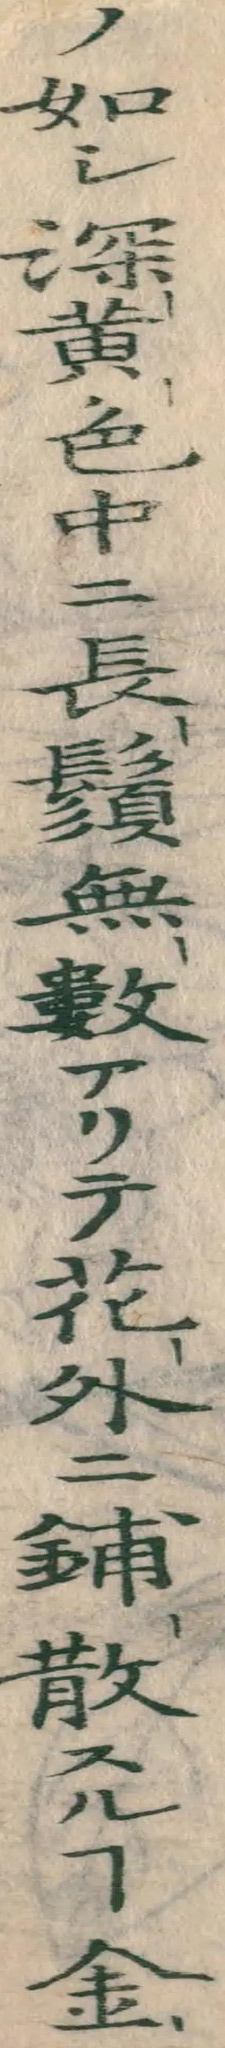ノ如シ深-黄-色中ニ長-鬚無-数アリテ花-外ニ鋪-散スルヿ金-
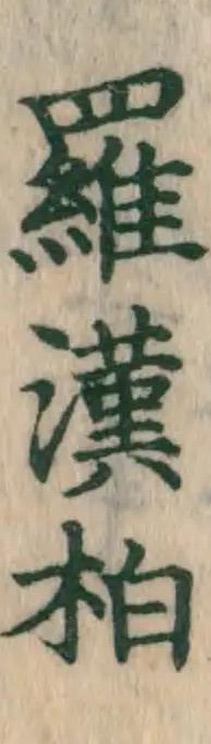羅漢柏

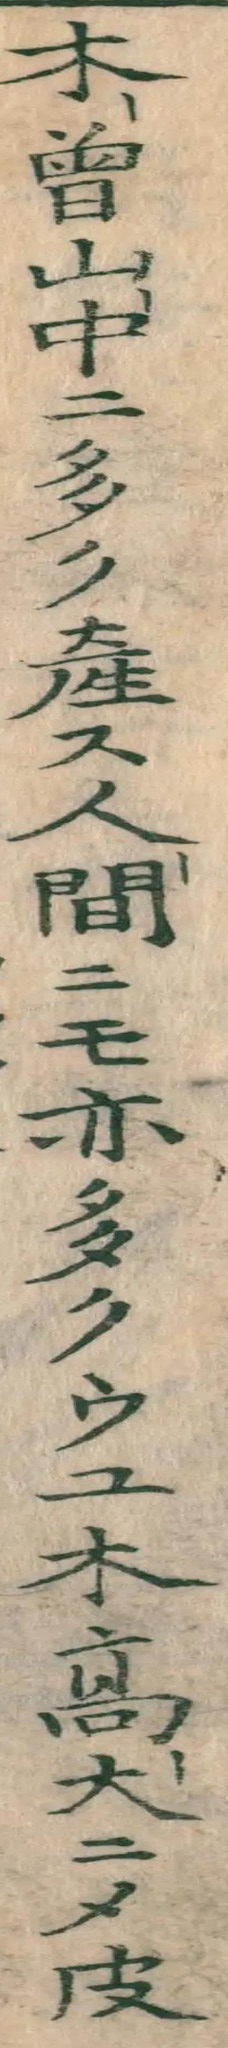木-曽山-中ニ多ク産ス人-間ニモ亦多クウユ木高-大ニシテ皮
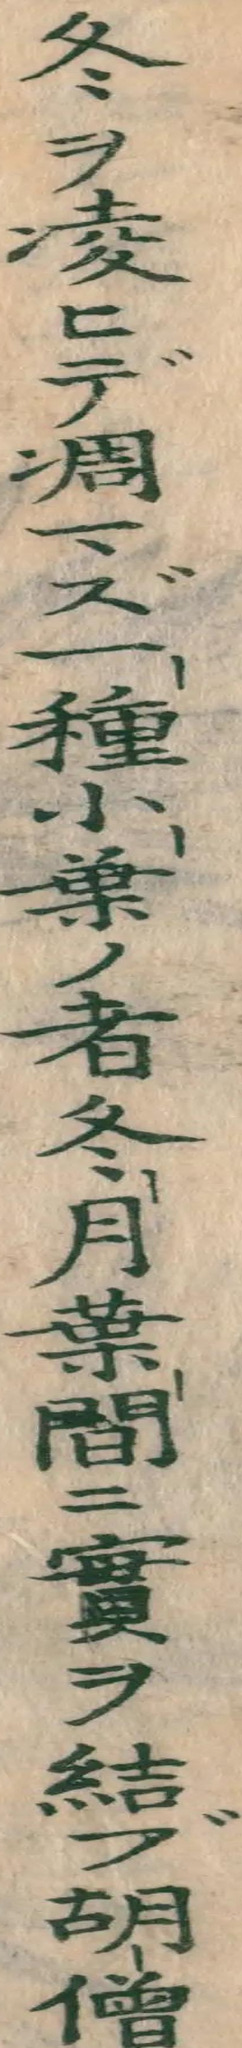冬ヲ凌ヒデ凋マズ一-種小-葉ノ者冬-月葉-間ニ実ヲ結ブ胡-僧
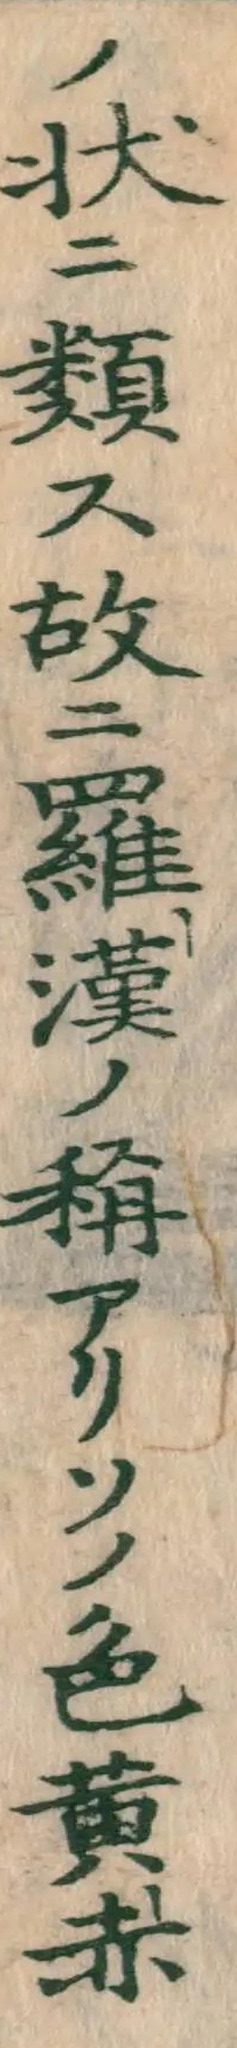ノ状ニ類ス故ニ羅-漢ノ称アリソノ色黄-赤

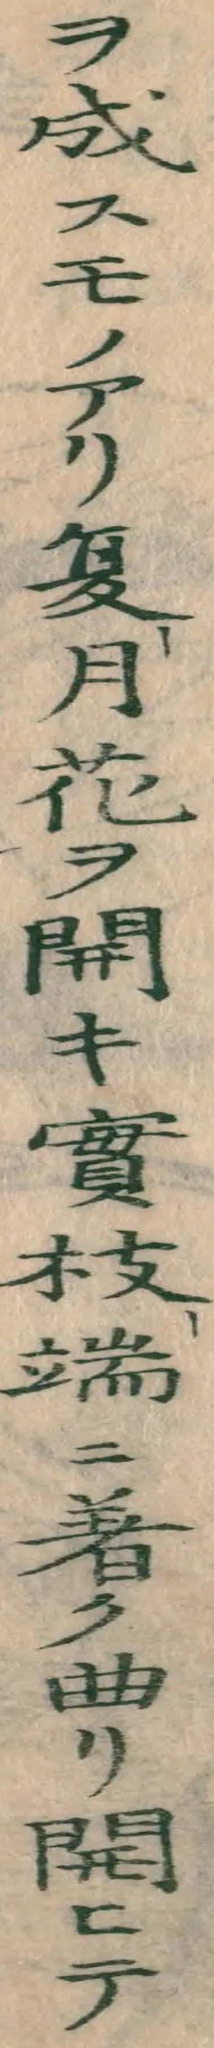ヲ成スモノアリ夏-月花ヲ開キ実枝-端ニ着ク曲リ開ヒテ

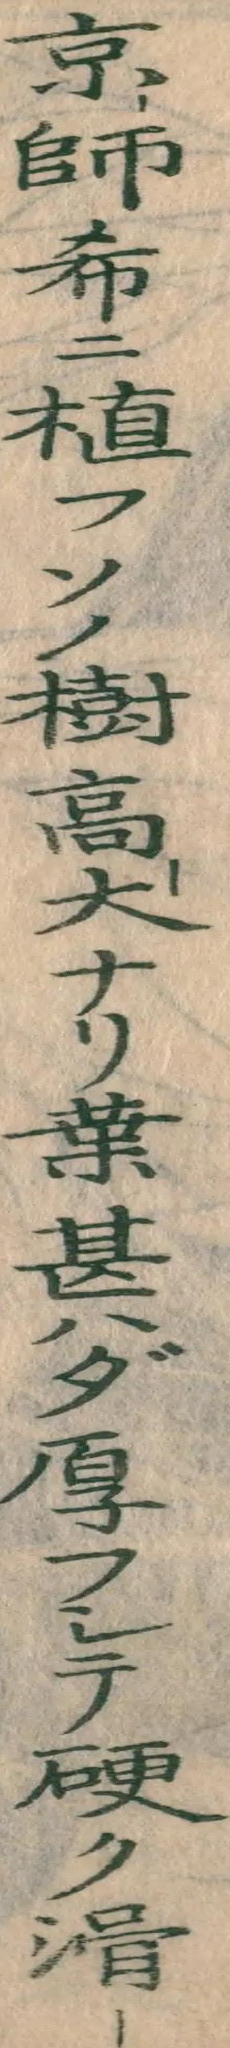京-師希ニ植フソノ樹高-大ナリ葉甚ハダ厚フシテ硬ク滑-
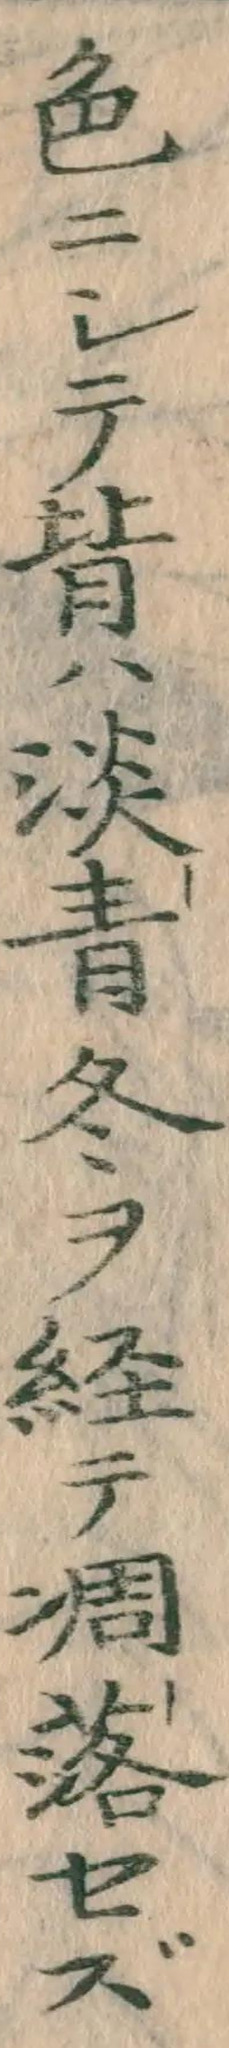色ニシテ背ハ淡-青冬ヲ経テ凋-落セズ

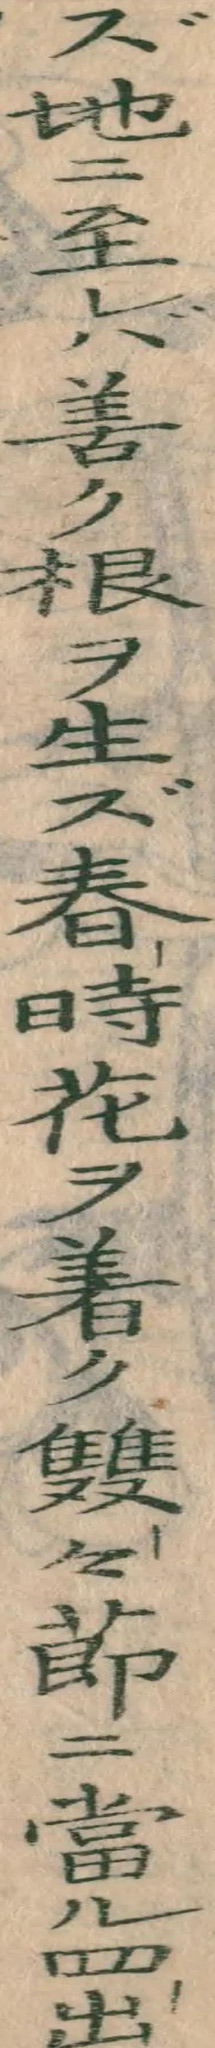ズ地ニ至レバ善ク根ヲ生ズ春-時花ヲ着ク双-々節ニ当ル四-出
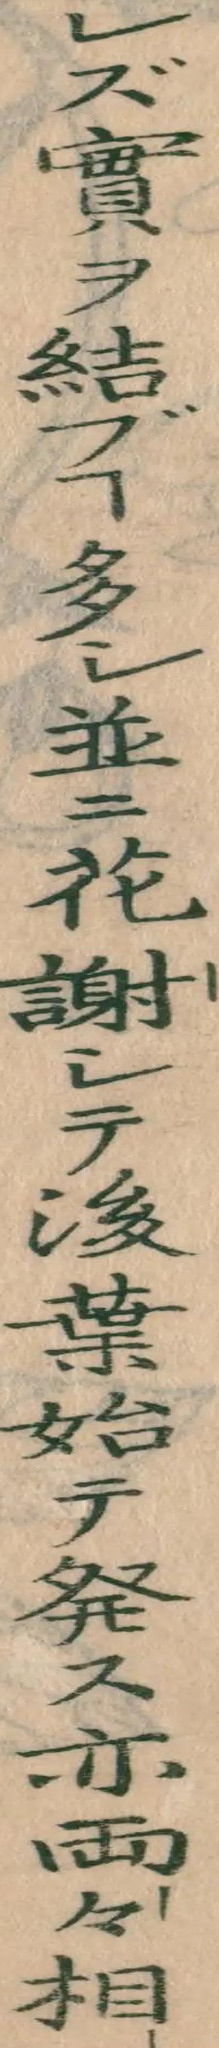レズ実ヲ結ブヿ多シ並ニ花謝シテ後葉始テ発ス亦両-々相-
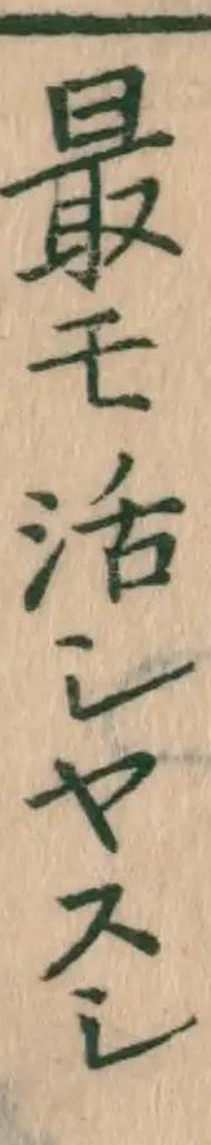最モ活シヤスシ

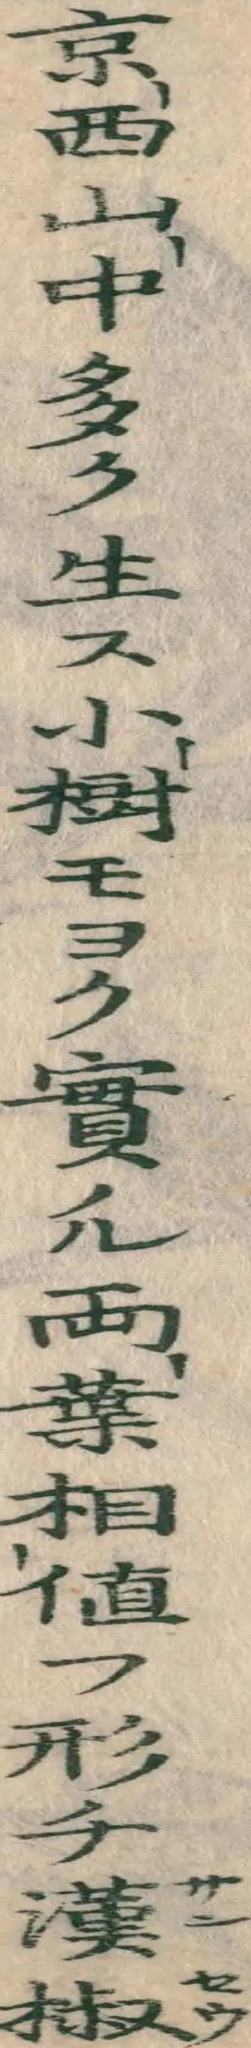京-西山-中多ク生ス小-樹モヨク実ノル両-葉相-値フ形チ漢椒
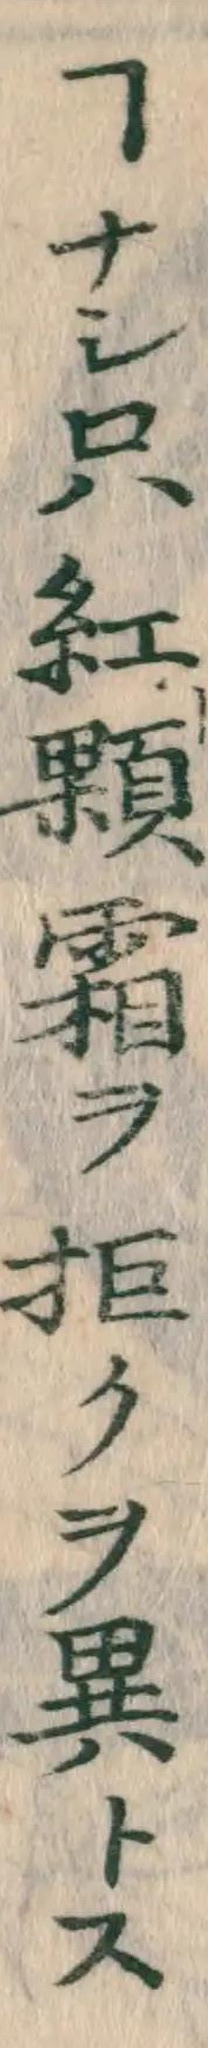ヿナシ只紅-顆霜ヲ拒クヲ異トス

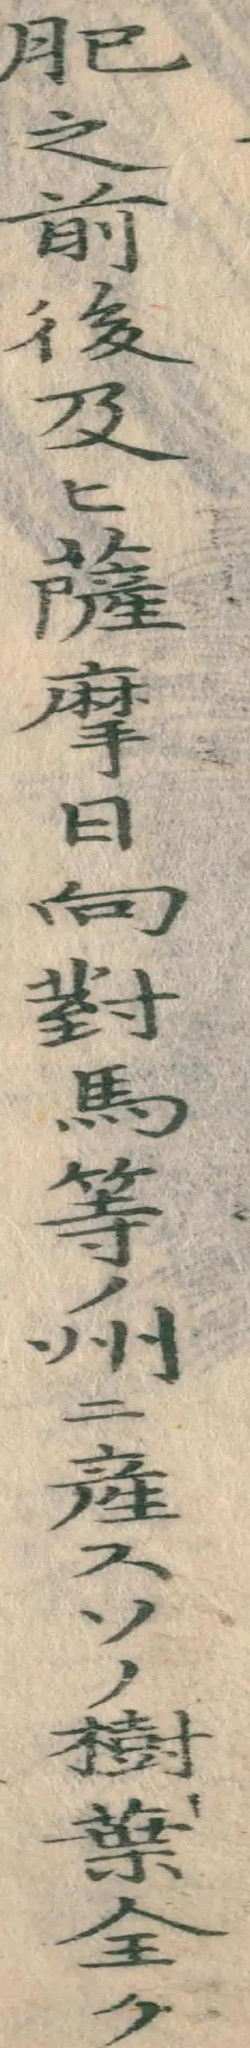肥之前後及ヒ薩摩日向対馬等ノ州ニ産スソノ樹-葉全ク
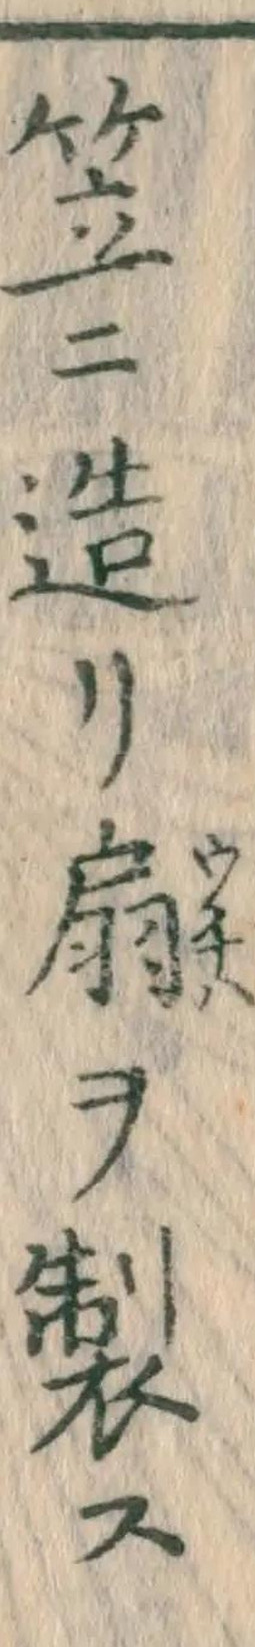笠ニ造リ扇ヲ製ス
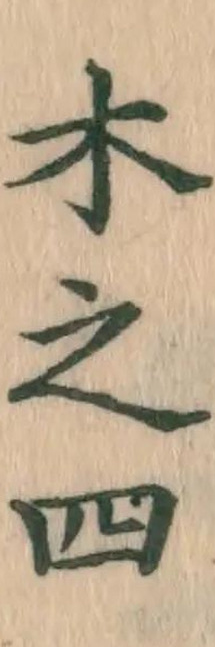木之四
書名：花彙 草部4巻木部4巻. [2]
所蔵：国立国会図書館 National Diet Library, JAPAN
